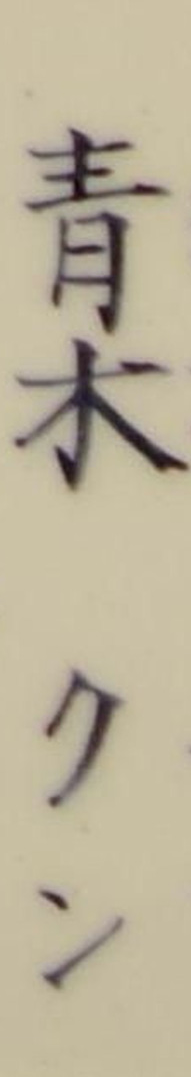青木クン
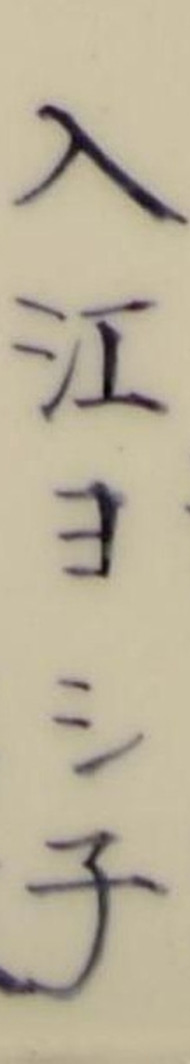入江ヨシ子
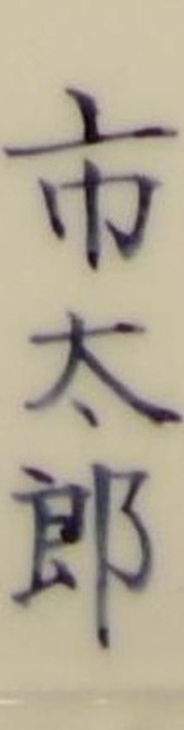市太郎
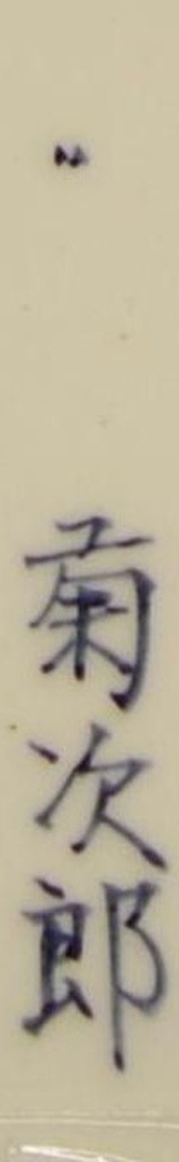藤次郎
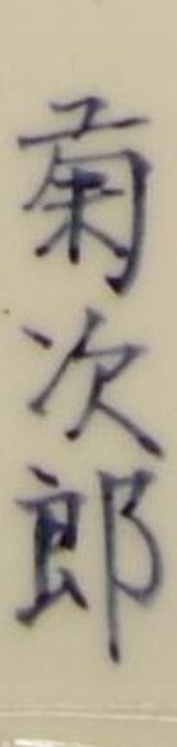藤次郎
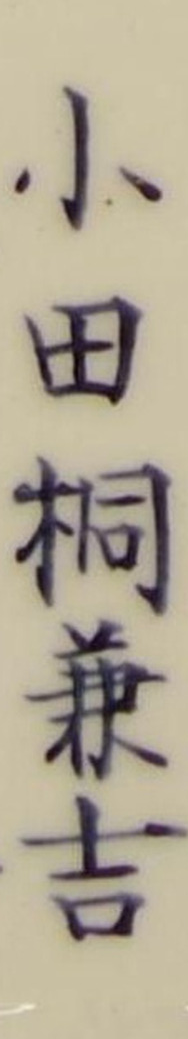小田桐兼吉
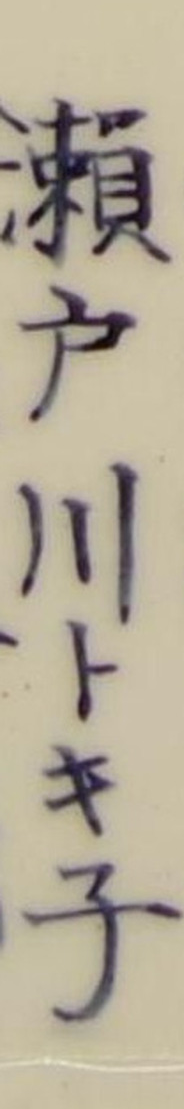瀬戸川トキ子
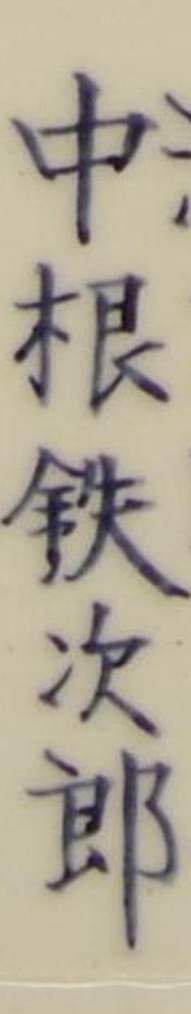中根鉄次郎
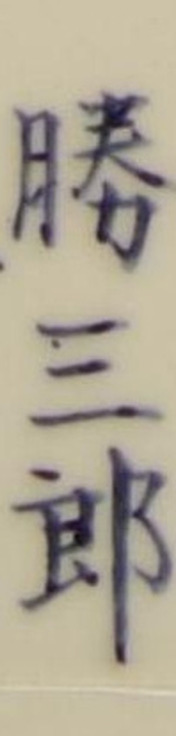勝三郎
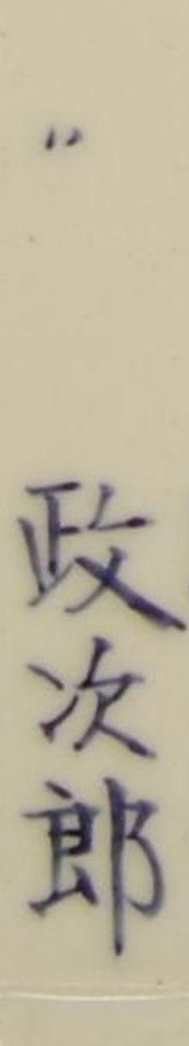政次郎
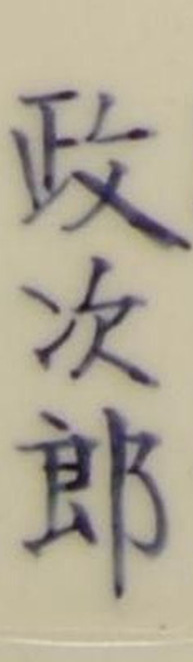政次郎

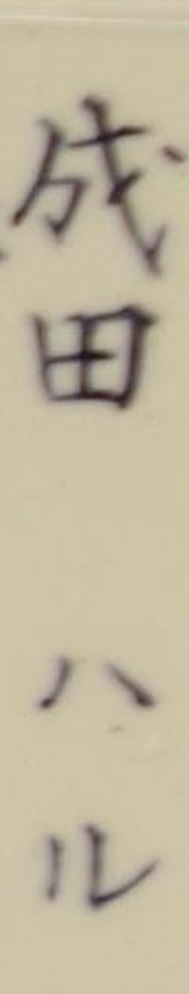成田ハル
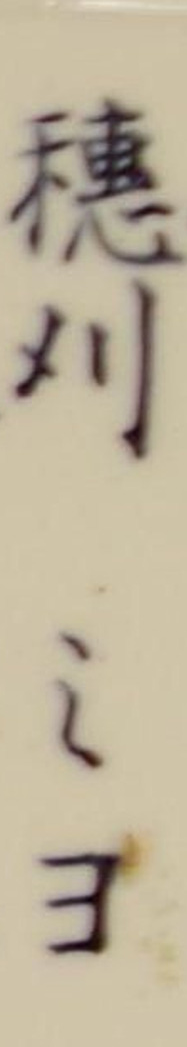穂刈ミヨ
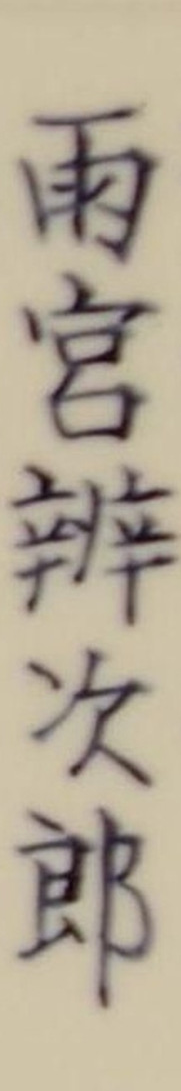雨宮辯次郎
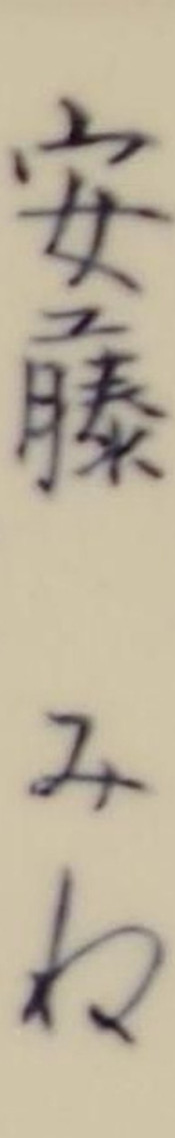安藤みね
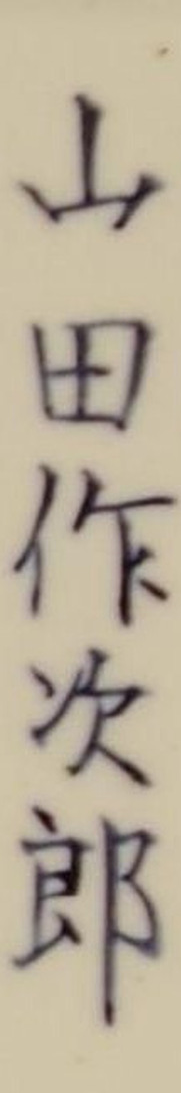山田作次郎
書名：E~L
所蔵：高野山金剛峯寺
